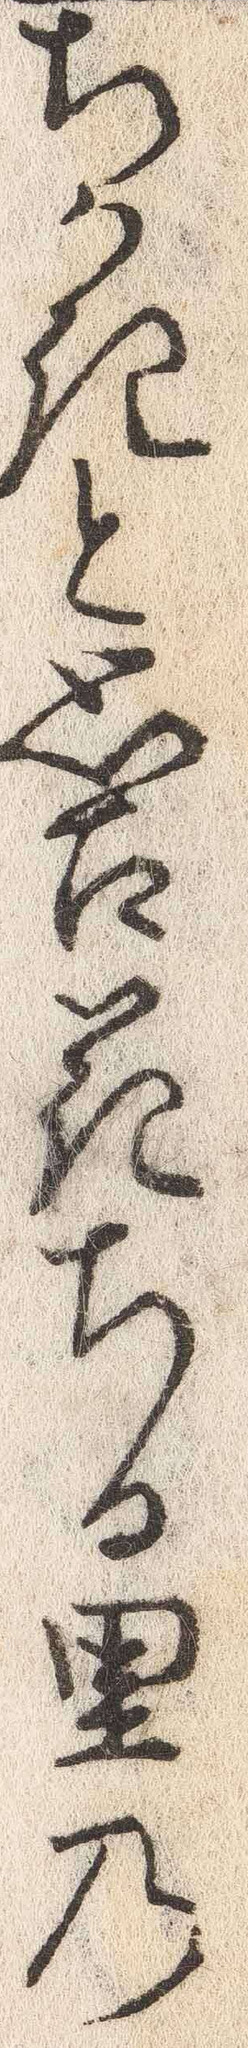ちかきと思召花ちる里の
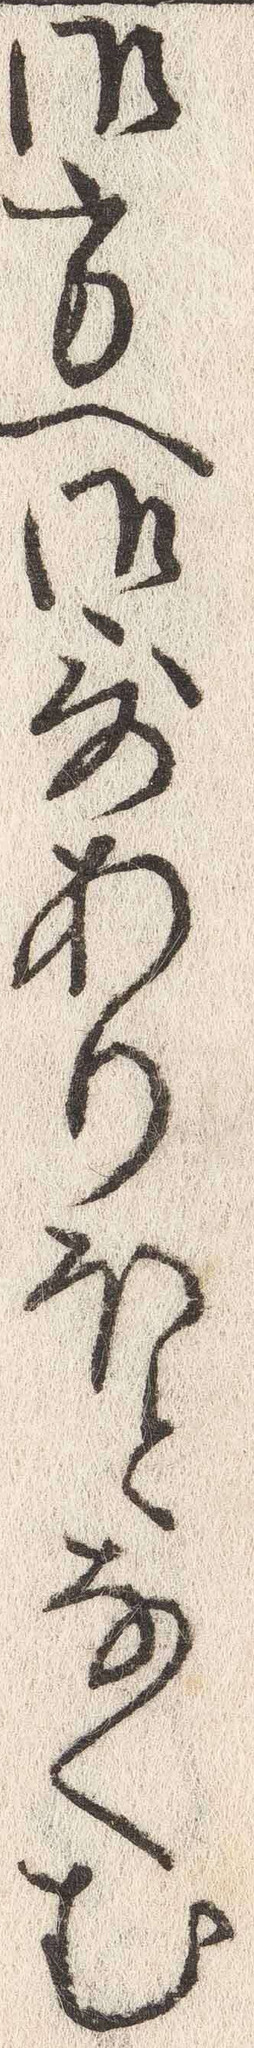御方へ御哥ありほとなくむ
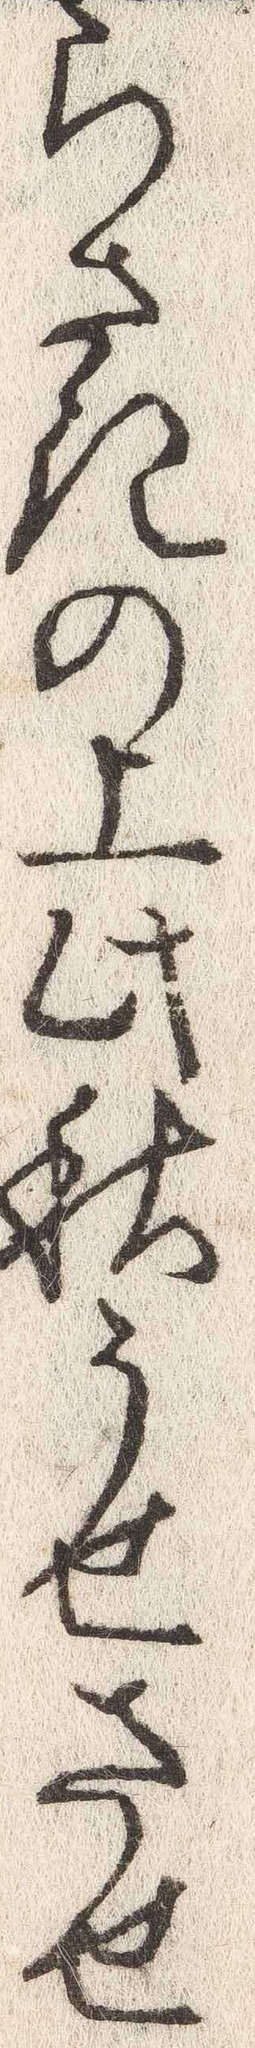らさきの上此秋うせさせ
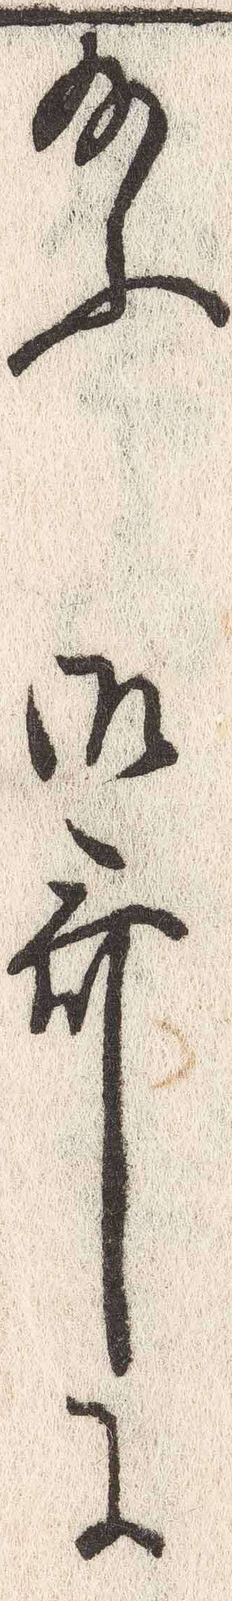給ふ御哥に
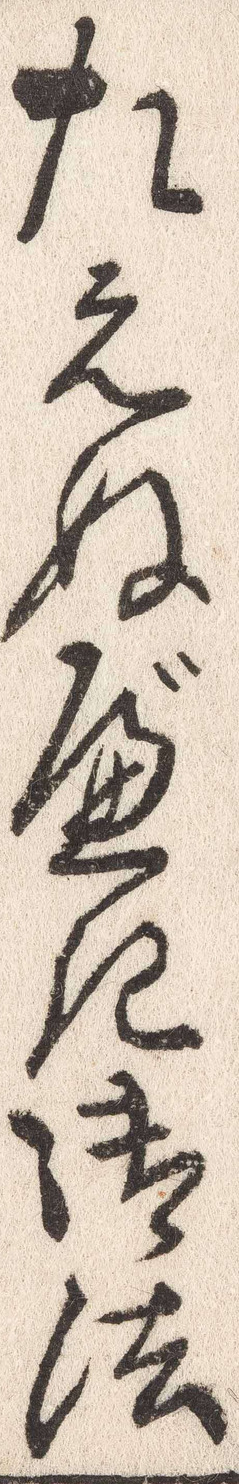たえぬべき御法
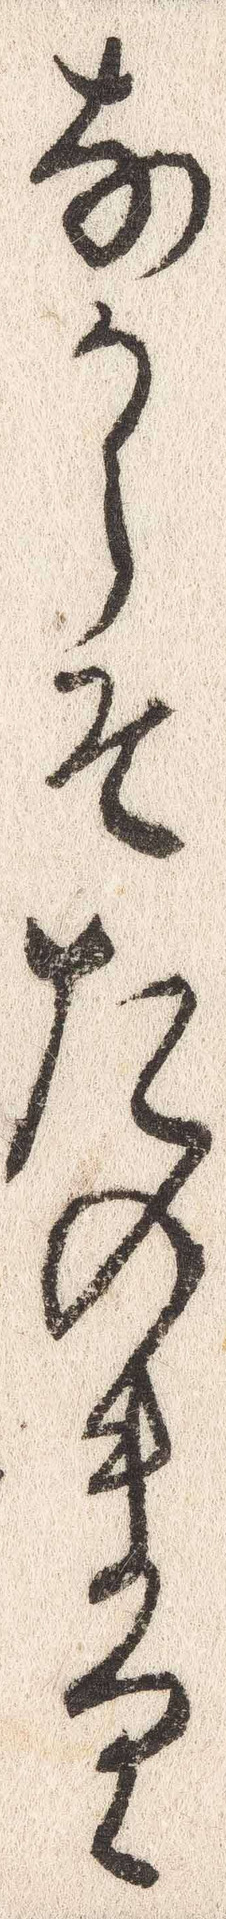なからそたのまるゝ
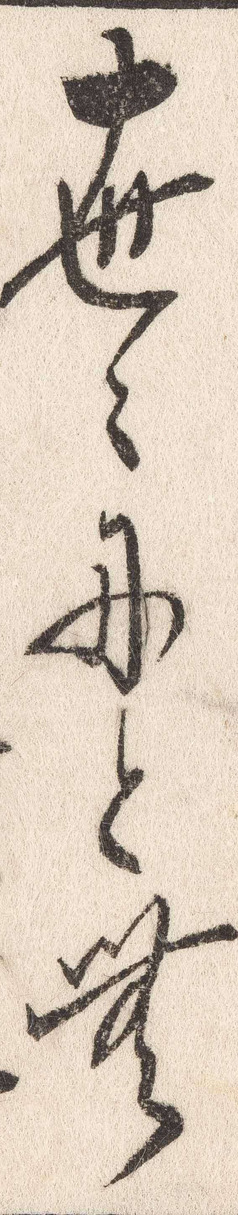世々にとむ
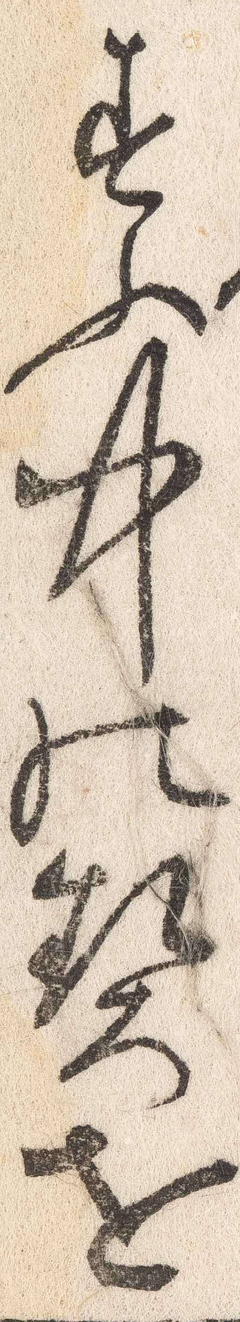すふ中の契を

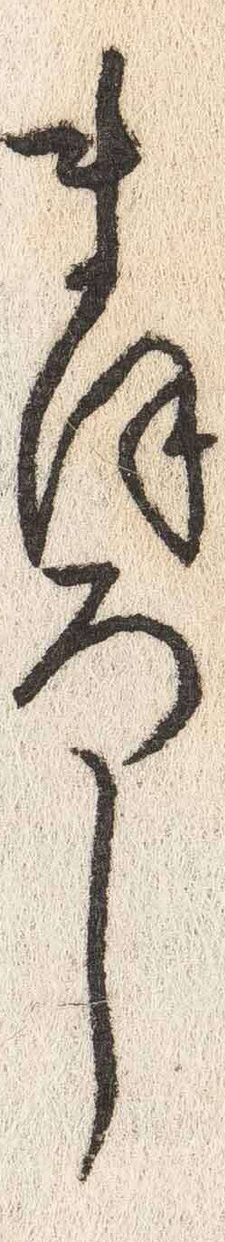まほろし
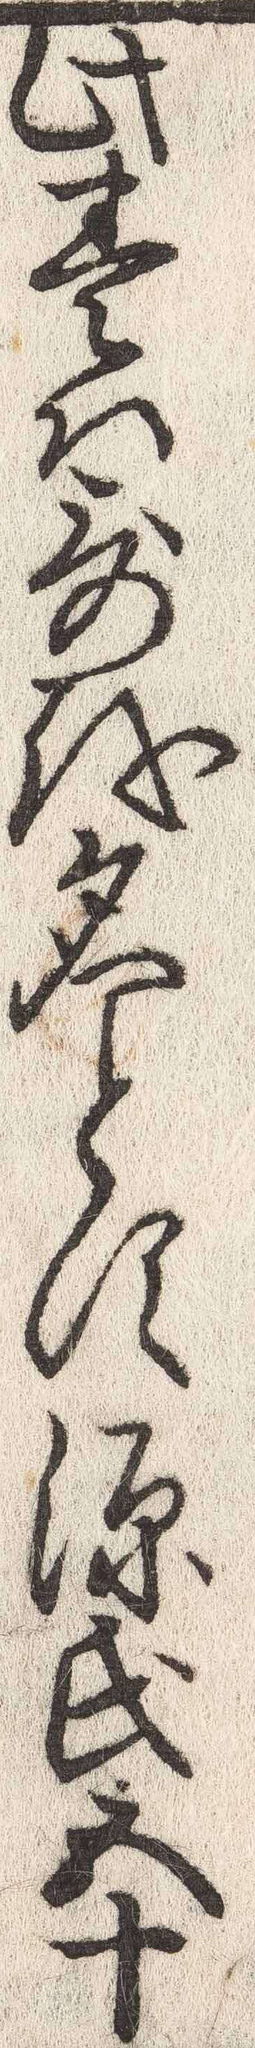此巻は哥を名とす源氏五十
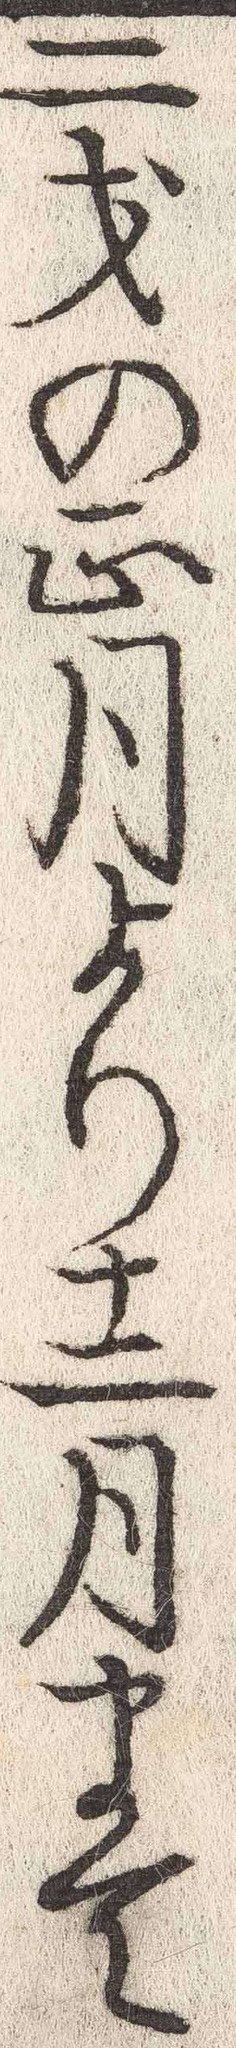二才の正月より十二月まて
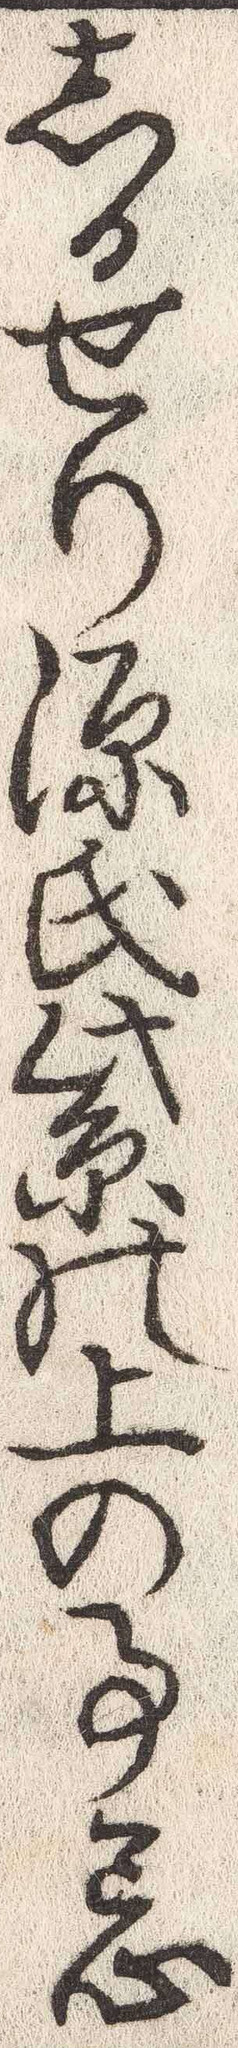しるせり源氏紫の上の事忘
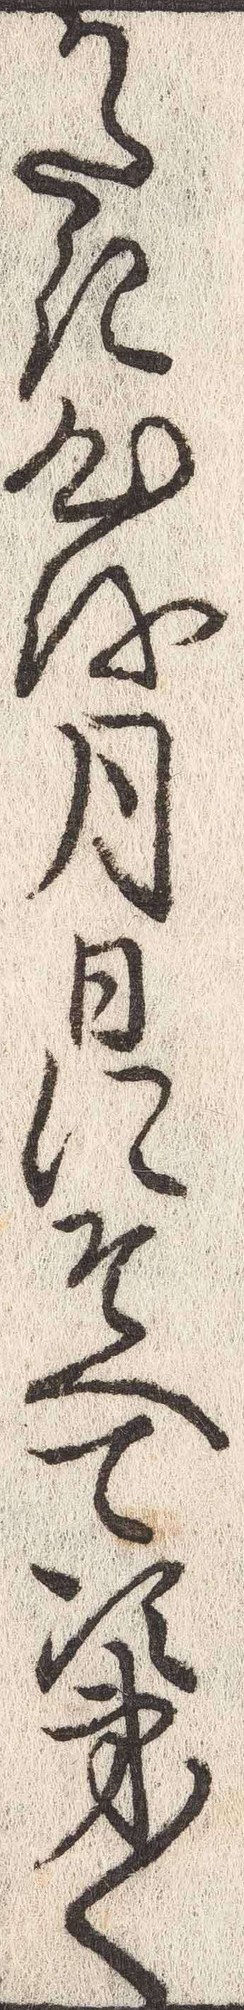かたき心を月日にそへて次第〳〵
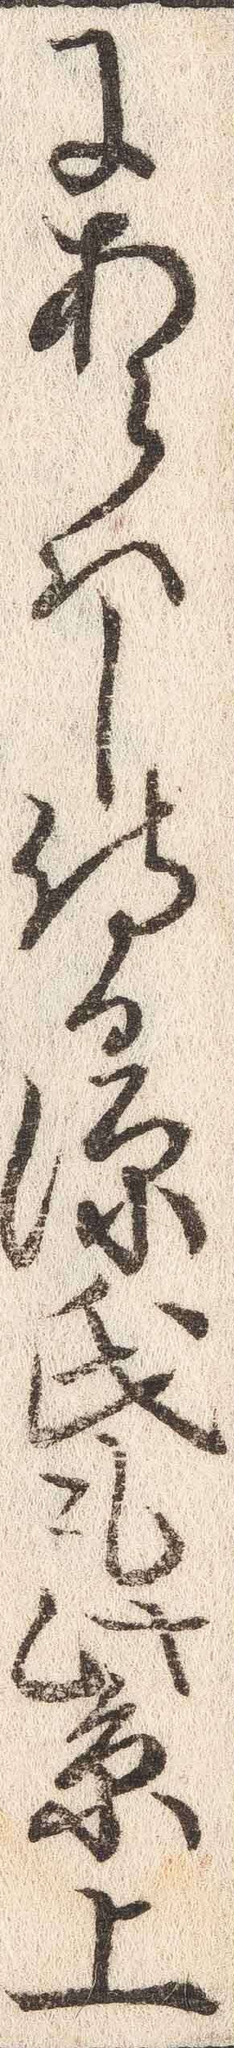にあらはし侍る源氏も紫上
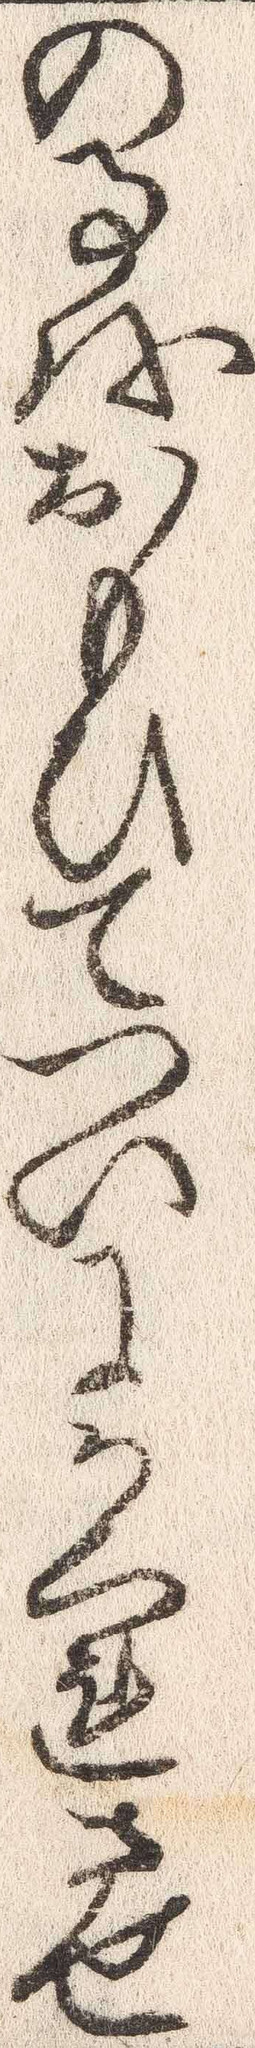の事をおもひてついにかくれさせ
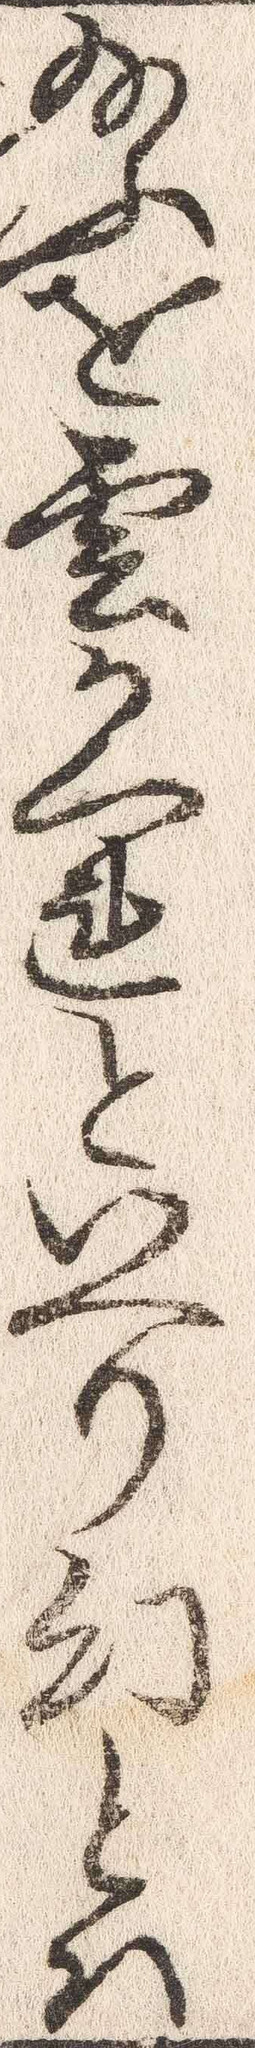給ふを雲かくれといへり幻とは
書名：源氏物語
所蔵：東京学芸大学附属図書館 国文学研究資料館
